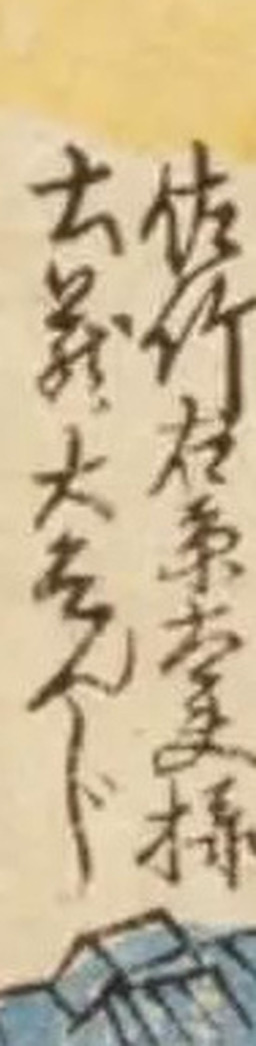土蔵大そんじ
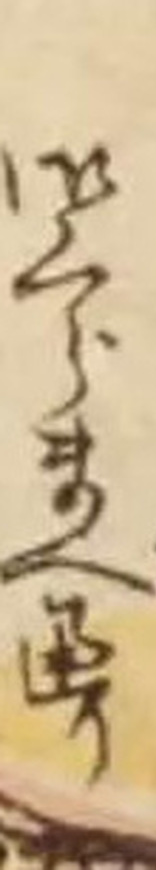御くらまへ通り
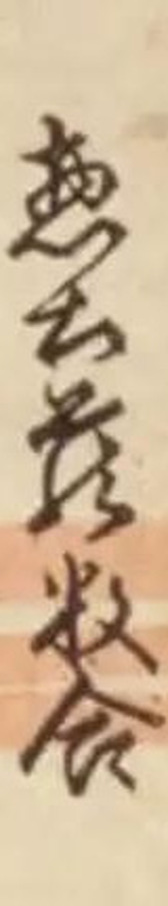惣土蔵数合
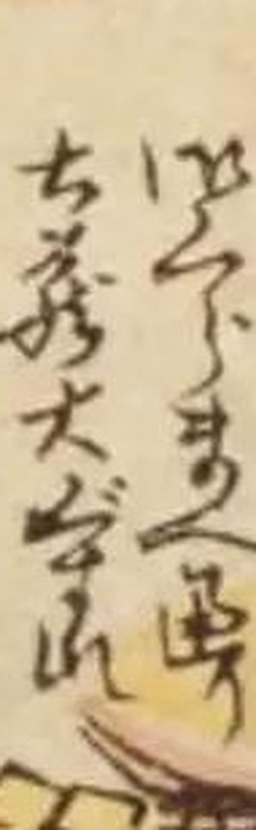土蔵大くずれ
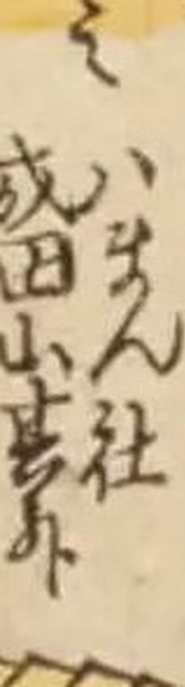成田山其外
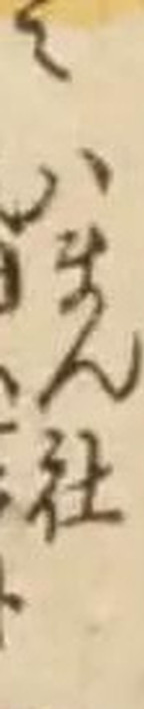八まん社
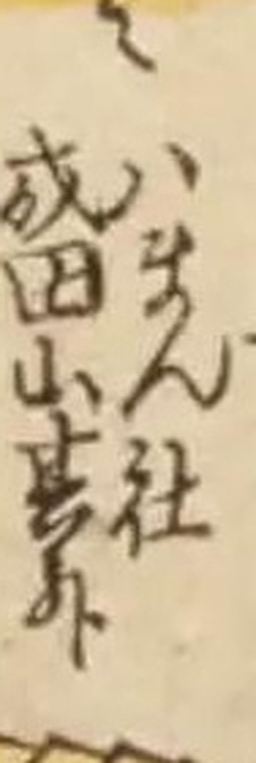成田山其外
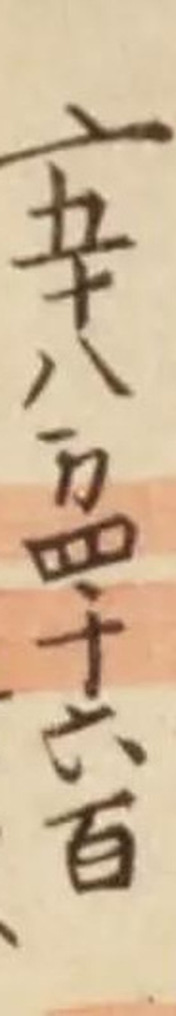〆五十八万四千六百
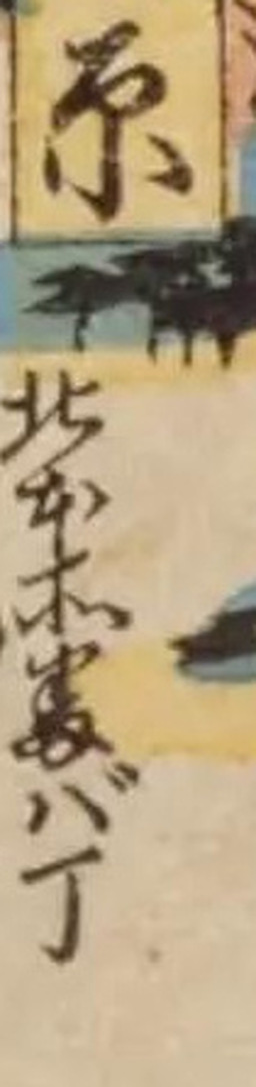北本所番ば丁
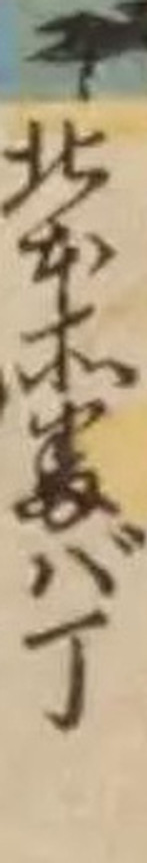北本所番ば丁
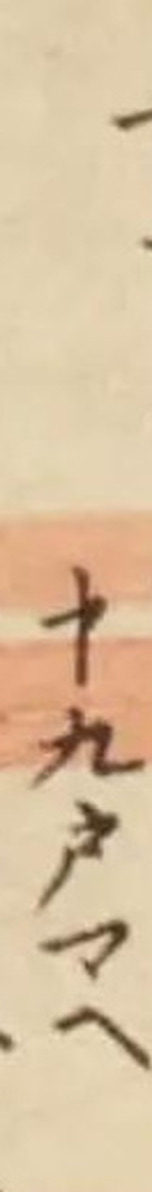十九戸まへ
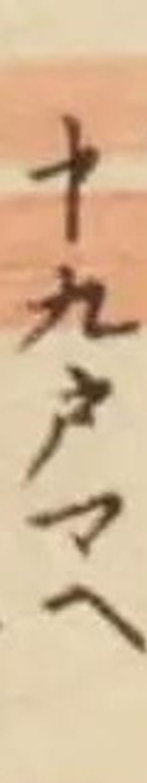十九戸まへ
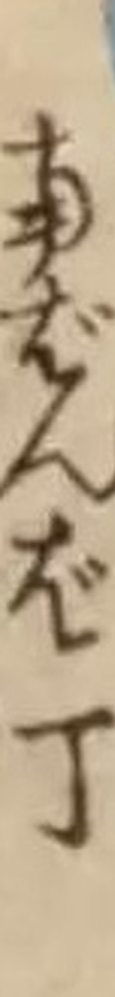南ばんば丁
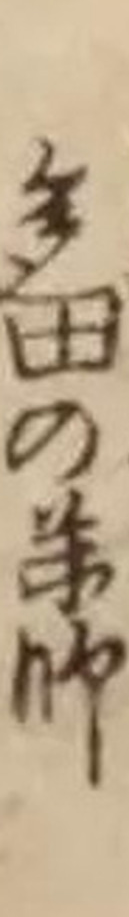多田の薬師
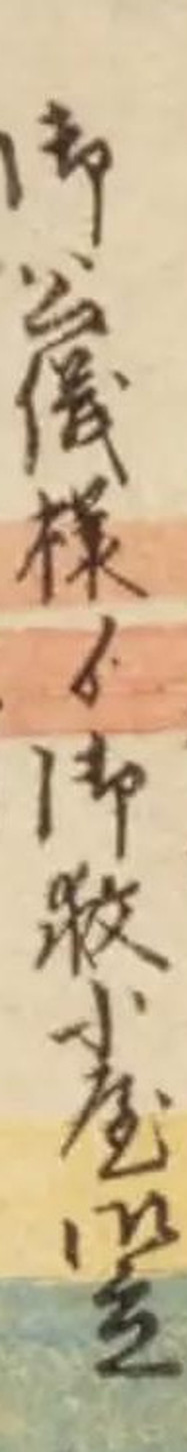御公儀様より御救小屋御立
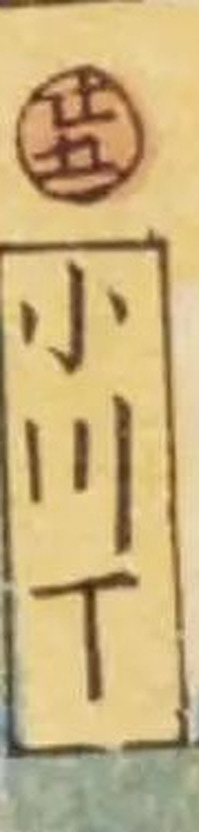山川丁
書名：銘細改板江戸大地震出火場所附
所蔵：国立国会図書館 National Diet Library, JAPAN
